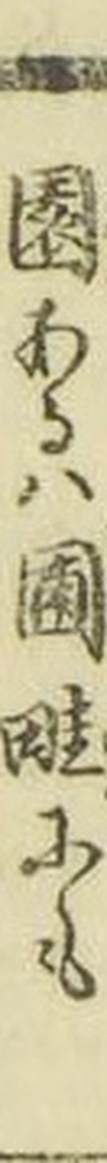園あるは圃畔にも
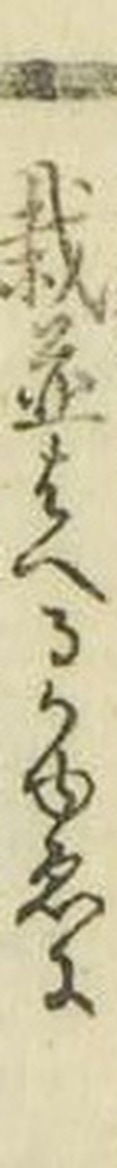植並はへるかゆゑに
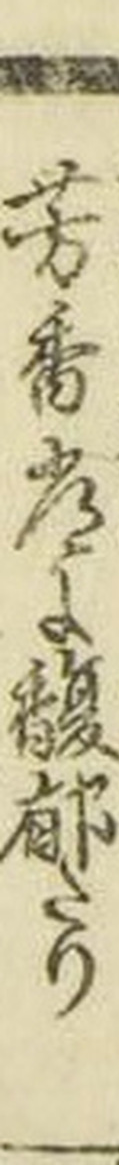芳香常に馥郁たり
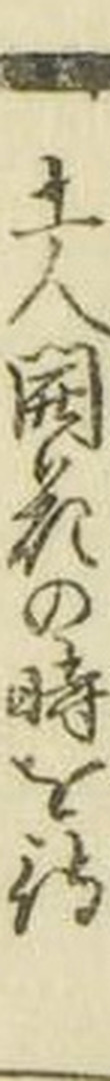土人開花の時を待
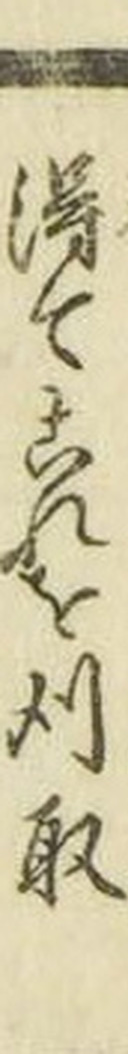得てこれを刈取
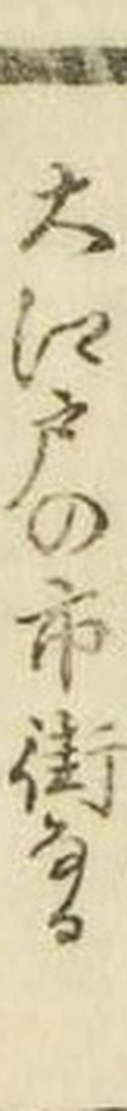大江戸の市街なる
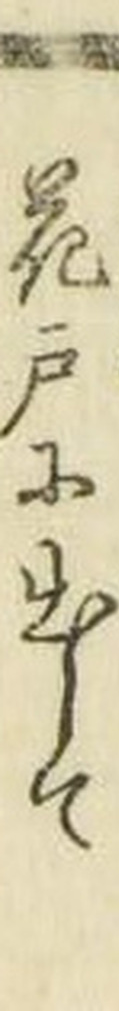花戸に出して
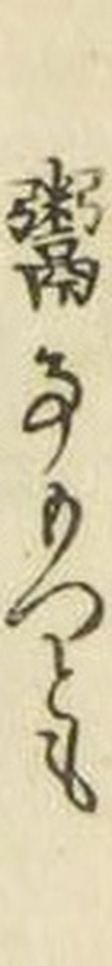鬻事もつとも

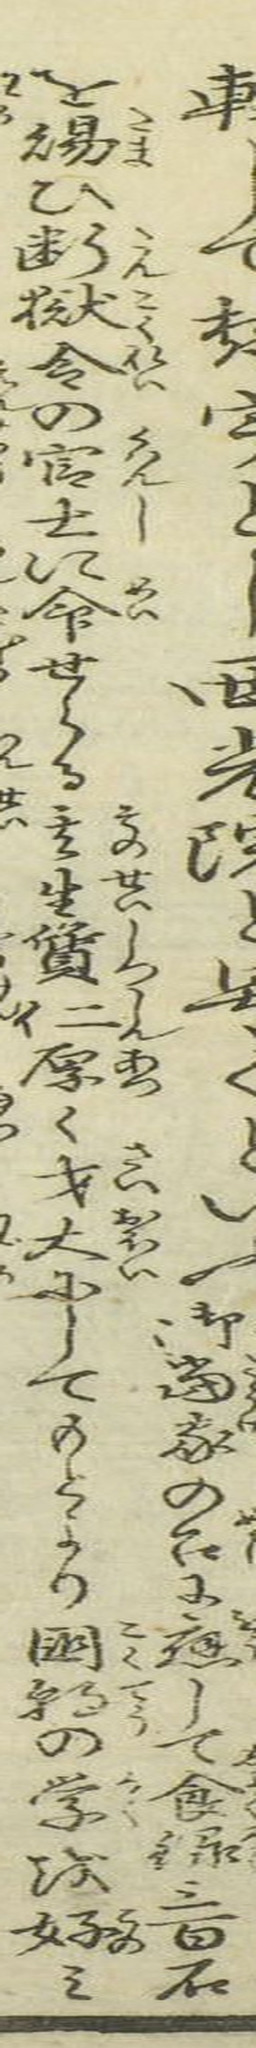を賜ひ断獄令の官士に命せらる其生質仁厚く才大にしてもとより国朝の学を好み
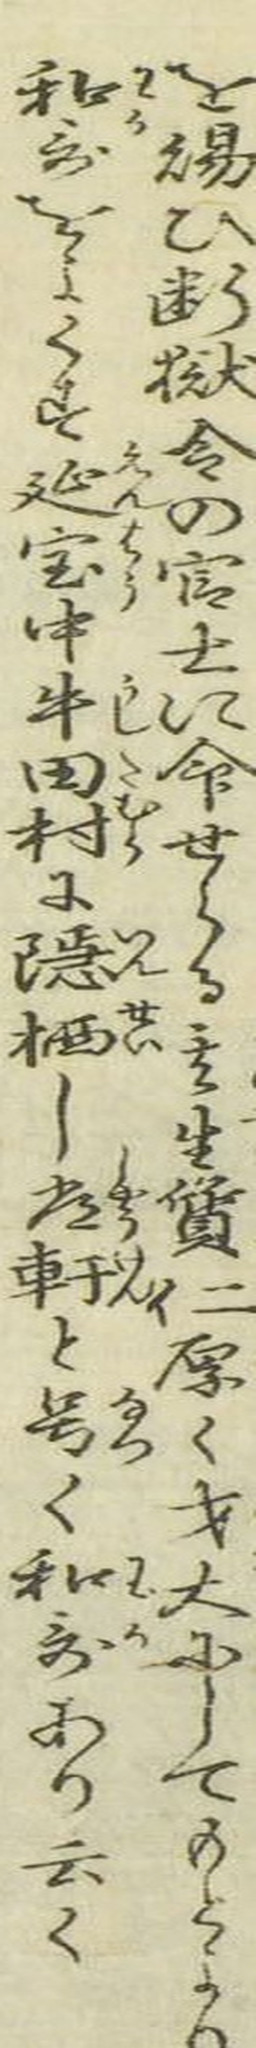和歌をよくす延宝中牛田村に隠栖し常軒と号く和歌あり云く
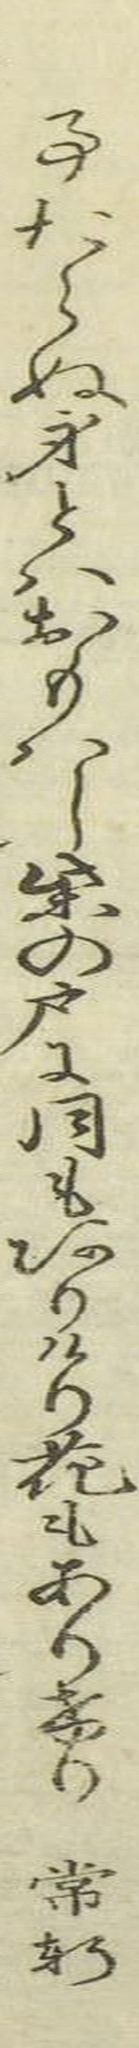事たらぬ身とはおもはし柴の戸に月もありけり花もありけり常軒
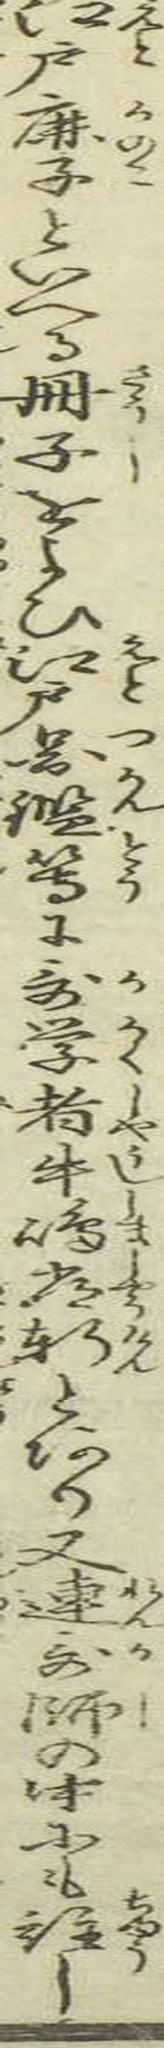江戸鹿子といへる冊子をよひ江戸図鑑等に哥学者牛島常軒とあり又連哥師の中にも註し
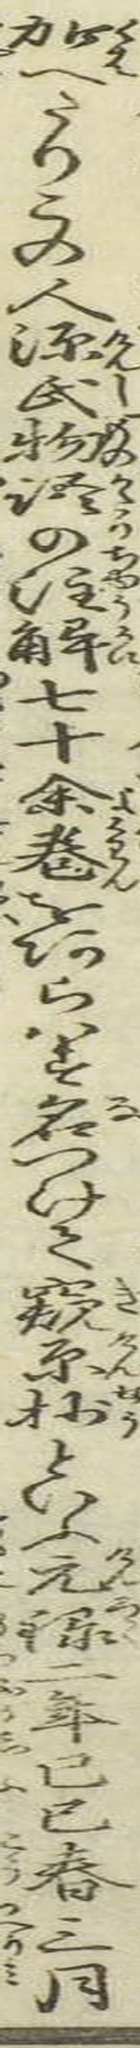加へざりこの人源氏物語の注解七十余巻をあらはす名つけて窺原抄といふ元禄二年己春三月
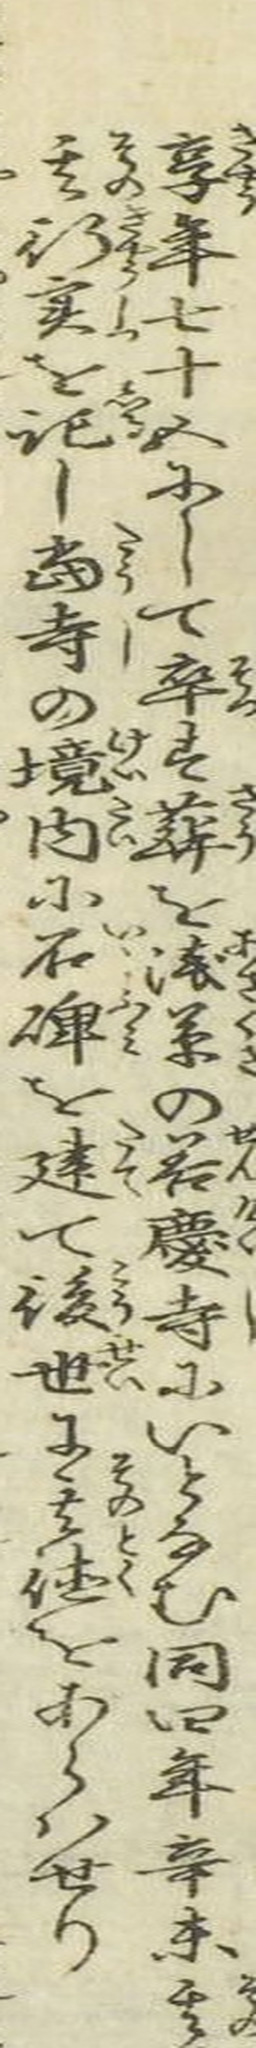其行実を記し当寺の境内に石碑を建て後世に其徳をあらはせり
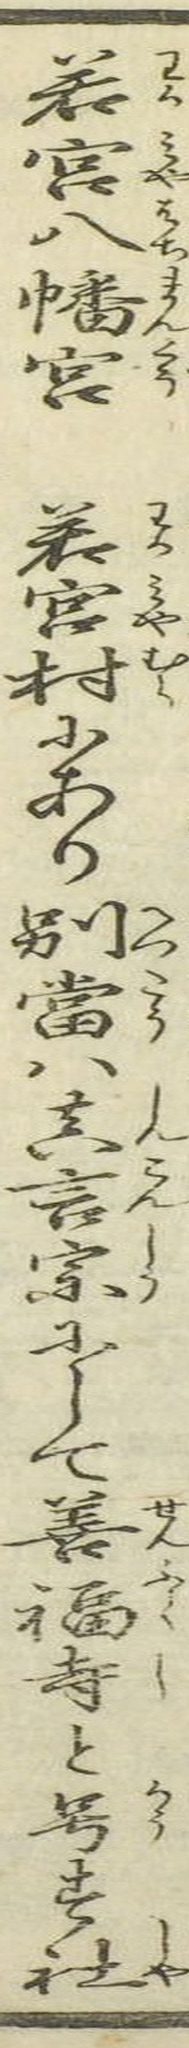若宮八幡宮若宮村にあり別当は真言宗にして善福寺と号す社
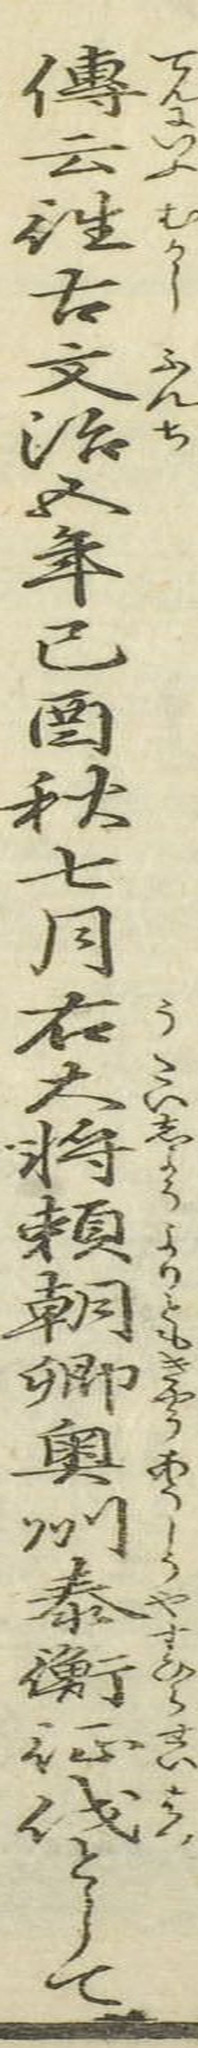伝云往古文治五年己酉七月右大将頼朝卿奥州泰衡征伐として
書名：江戸名所図会 20巻 巻之19
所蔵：東京学芸大学教育コンテンツアーカイブ
